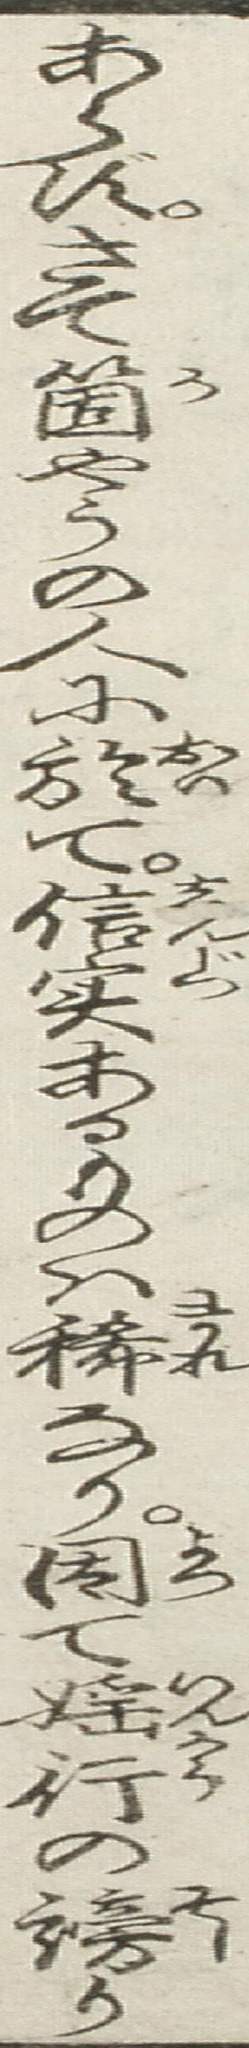あらず。さて箇やうの人に於て。信実あるものは稀なり。因て婬行の謗り
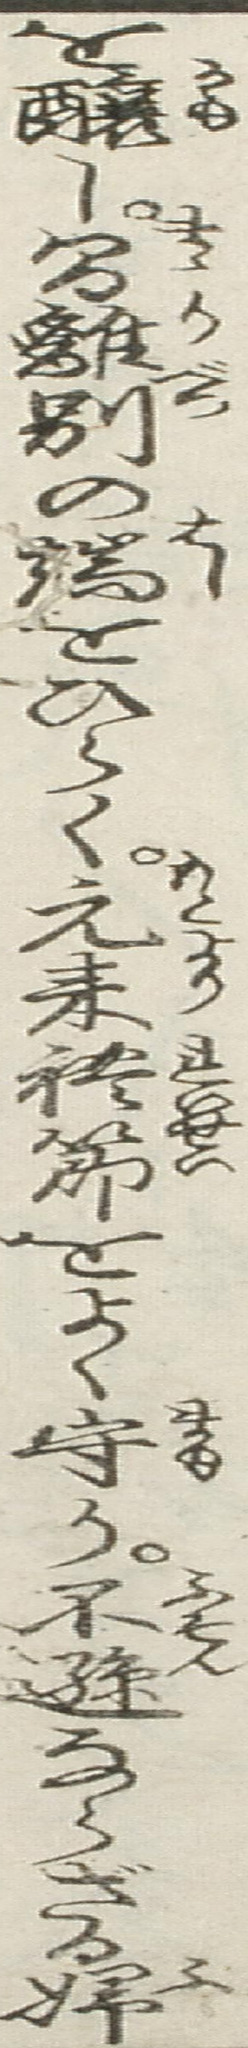を醸し。間別離の端をひらく。元来礼節をよく守り。不遜ならざる婦
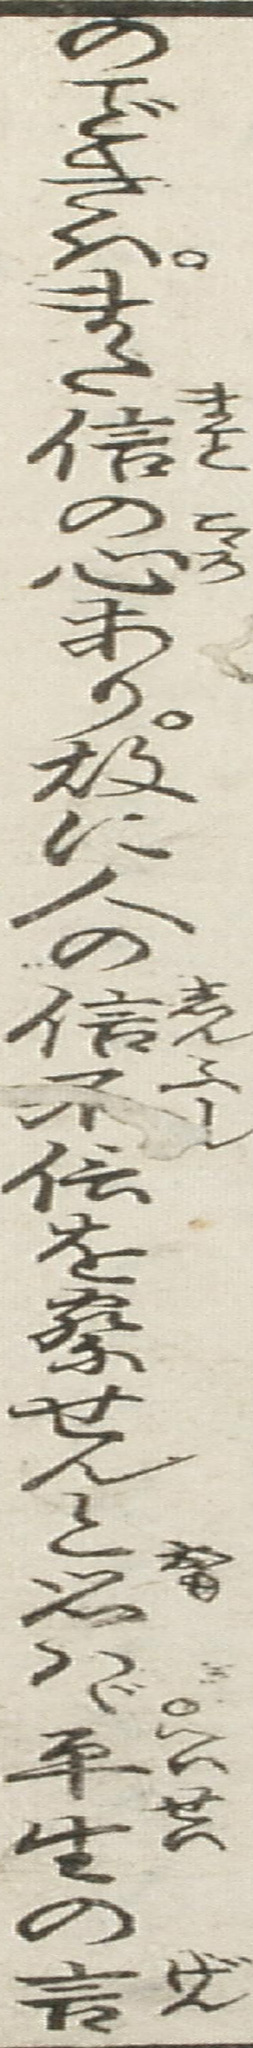のごときは。また信の心あり。故に人の信不信を察せんと思はゞ。平生の言
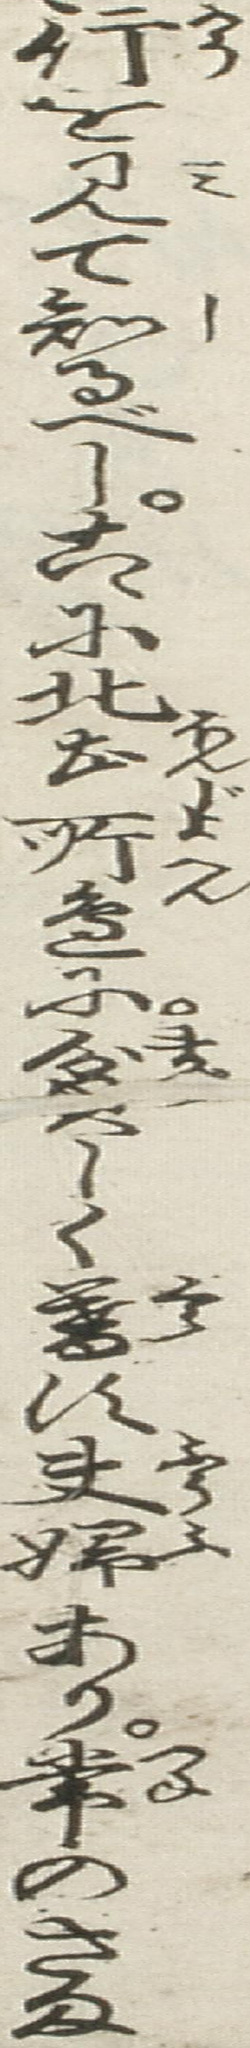行を見て知るべし。こゝに北本所辺に。貧しく暮す夫婦あり。常のさま
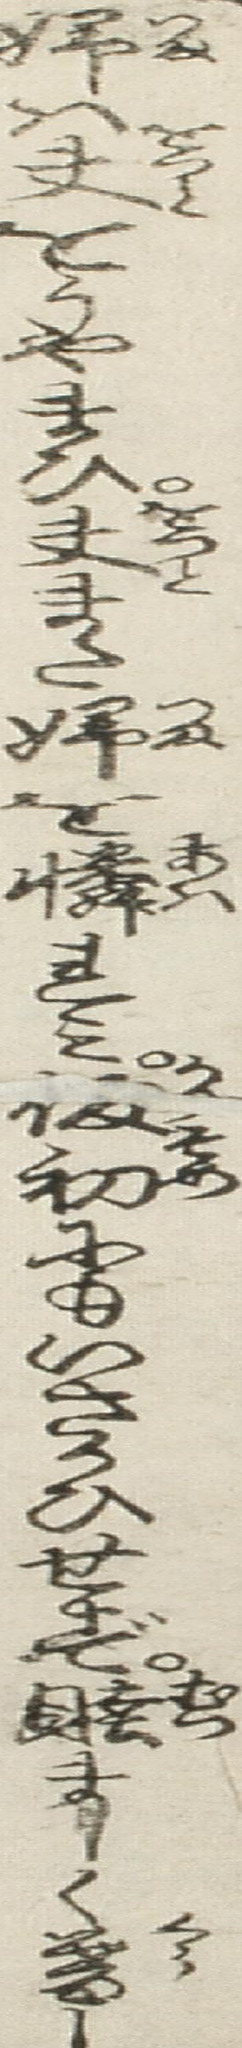婦は夫をうやまひ。夫また婦を憐れみ。仮初にもいさかひせず。睦ましく暮し
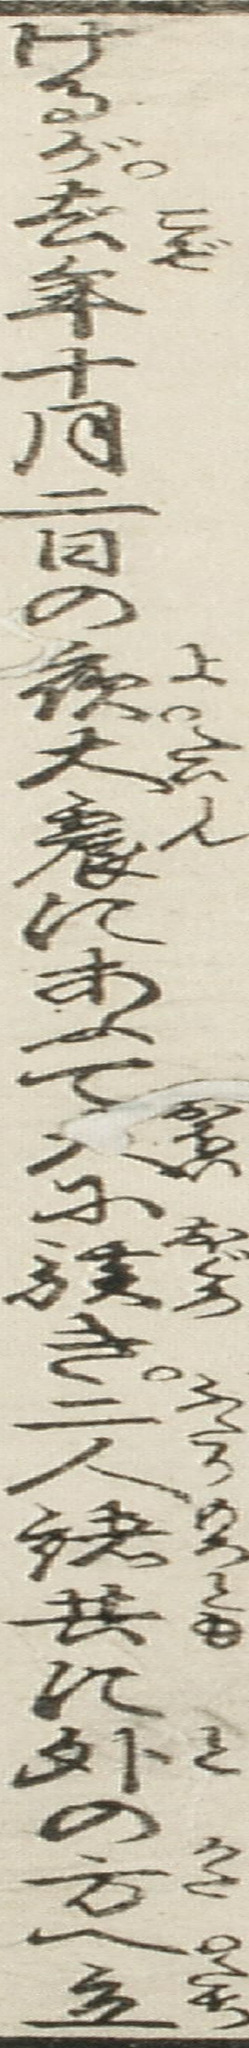けるが。去年十月二日の夜。大震にあふて大に駭き。二人諸共に外の方へ。立
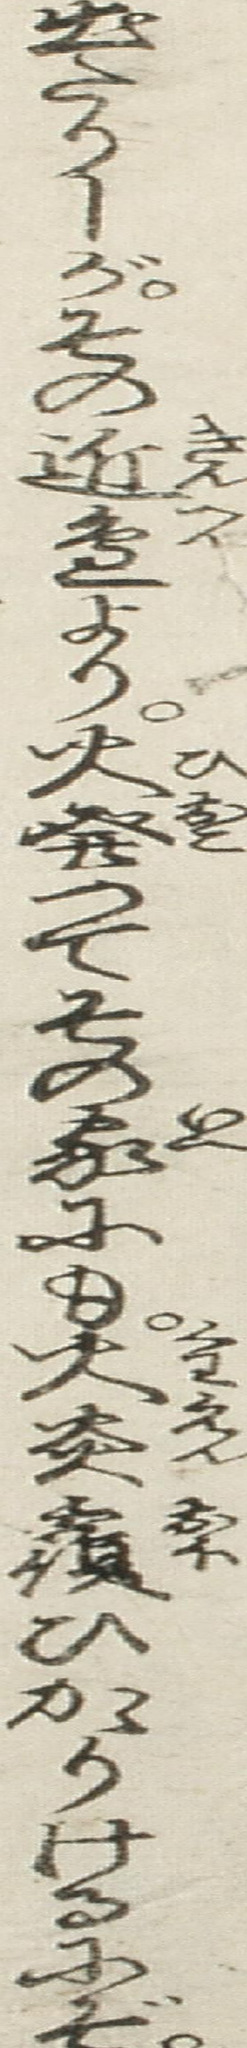出たりしが。その近辺より。火発つてその家にも火炎覆ひかゝりけるにぞ。
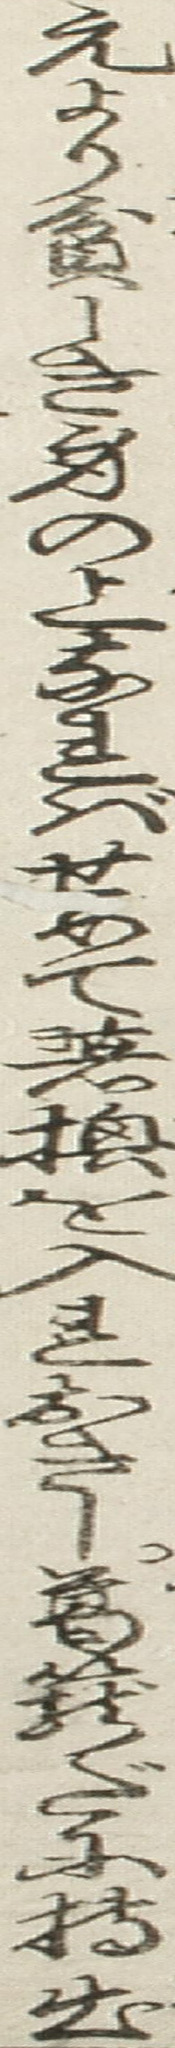元より貧しき身の上なれば。せめて着換を入れおきし。葛籠だに持出
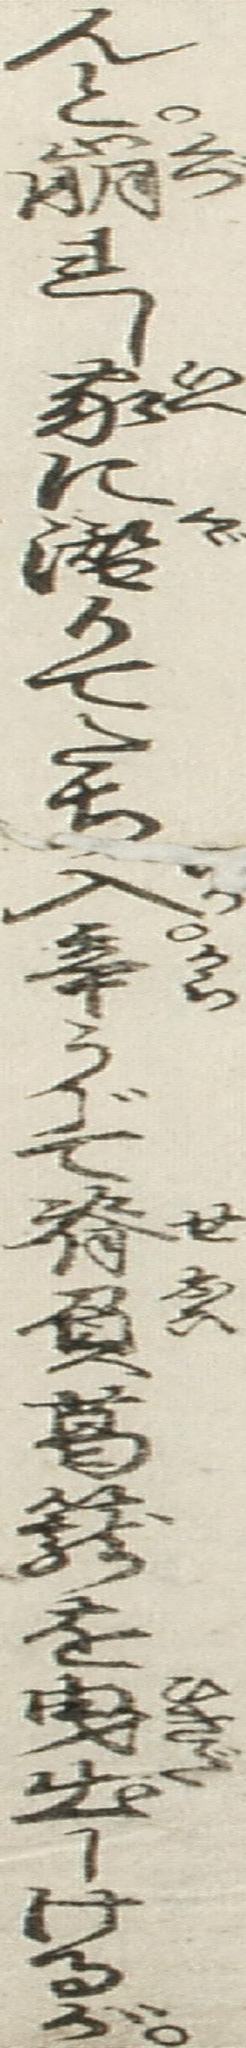んと。崩れし家に潜りてたち入。辛うじて背負葛籠を曳出しけるが。
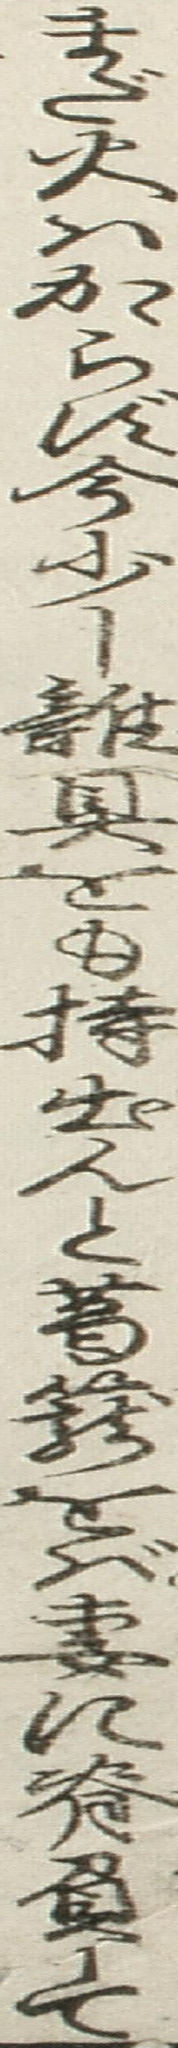まだ火はかゝらず。今少し雑具をも持出んと葛籠をば。妻に背負して
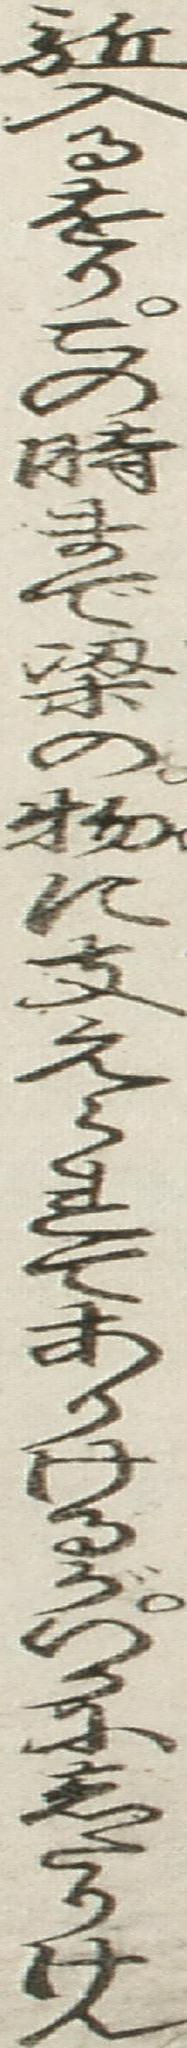駈入るをり。この時まで梁の。物に支えられてありけるが。いかにしたりけん
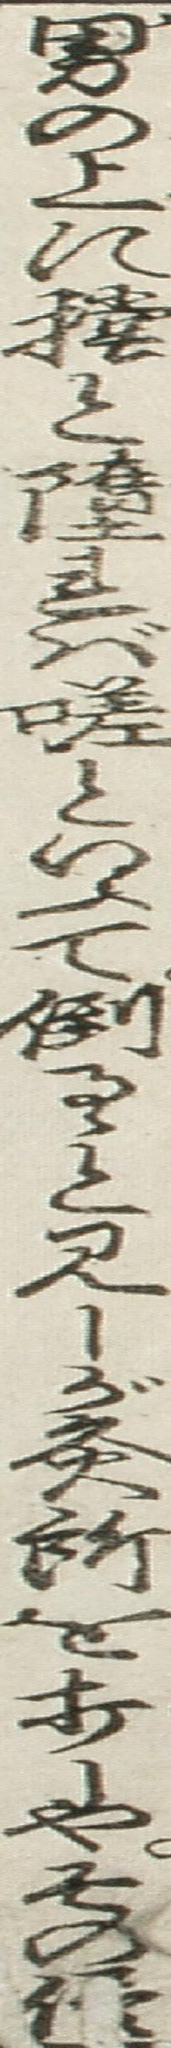男の上に。摚と堕れば嗟といふて。倒るゝと見しが灸所を打しや。その侭
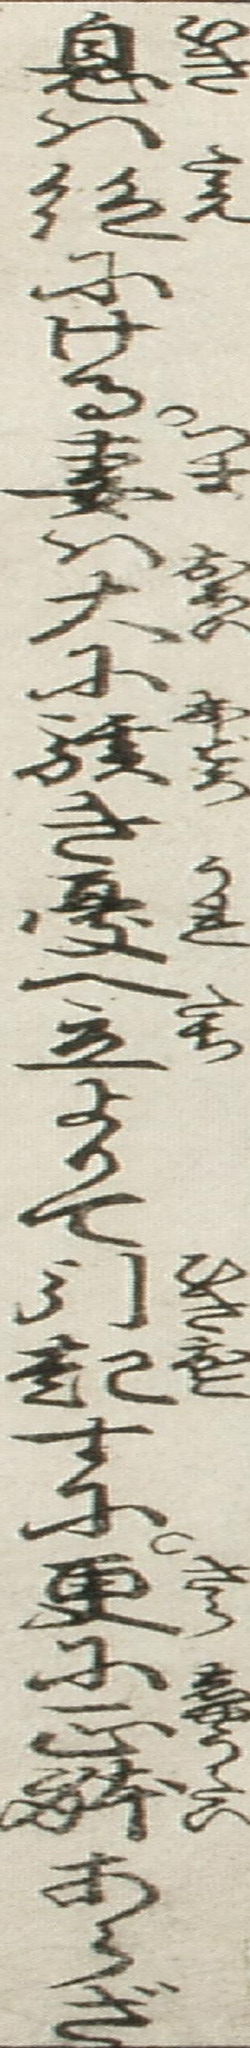息は絶にける。妻は大に駭き憂へ立よりて引起すに。更に正体あらざ
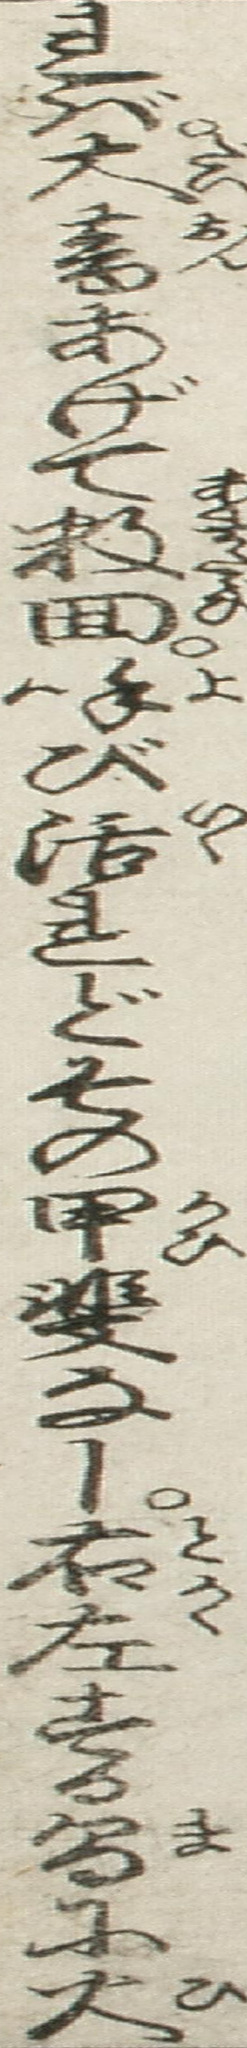れば。大音あげて数回。呼び活れどその甲斐なし。右左する間に火
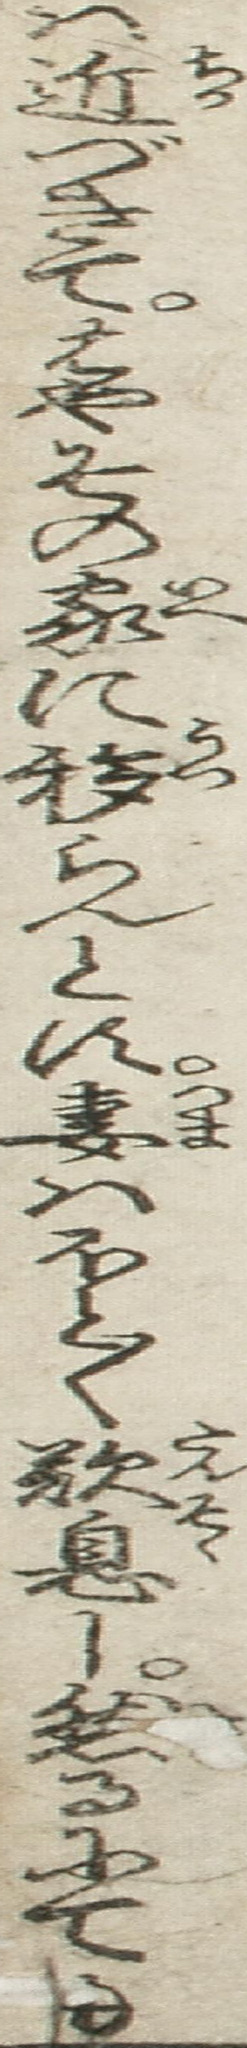は近づきて。はやその家に移らんとす。妻はほと〳〵歎息し。然るにても

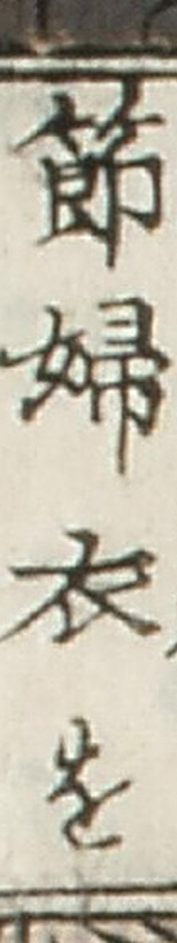節婦衣を
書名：安政見聞録　下
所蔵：東京大学地震研究所図書室 Earthquake Research Institute Library, The University of Tokyo, JAPAN
